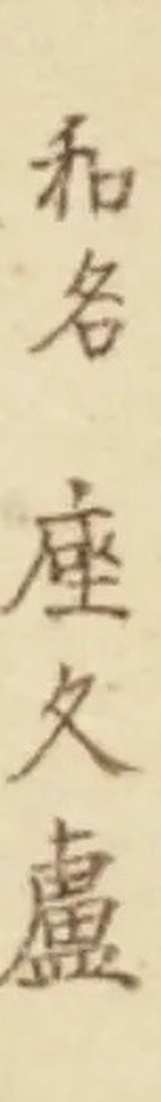和名座久盧
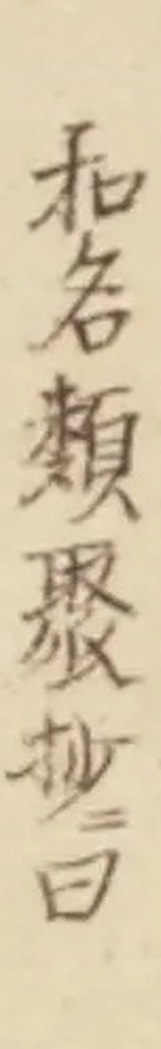和名類聚抄ニ曰
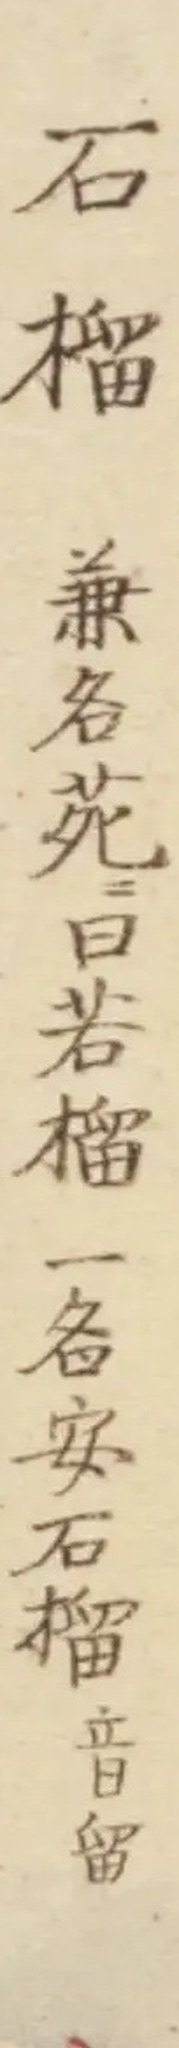石榴兼名苑に曰若榴一名安石榴音留
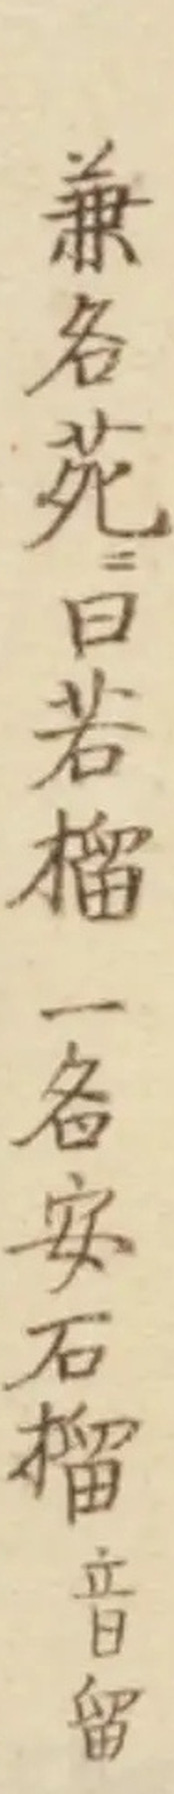石榴兼名苑に曰若榴一名安石榴音留
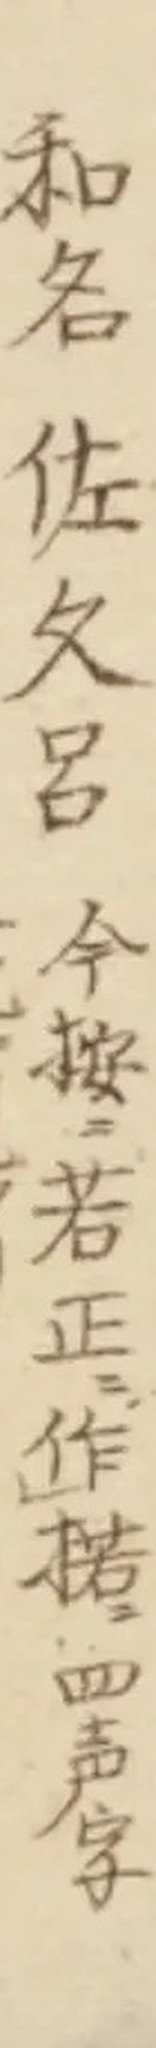和名佐久呂今按に若正にに四声字
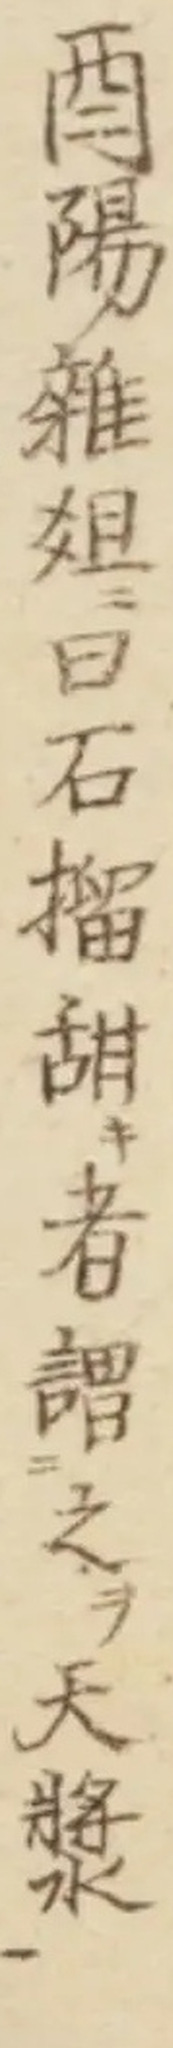酉陽雑爼に曰石榴甜き者謂之を天漿
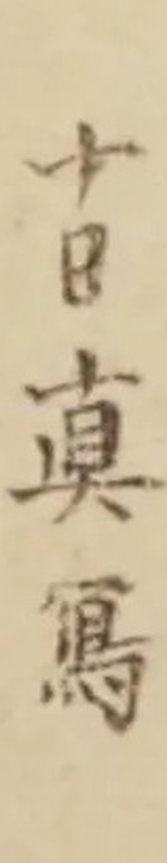十日真寫

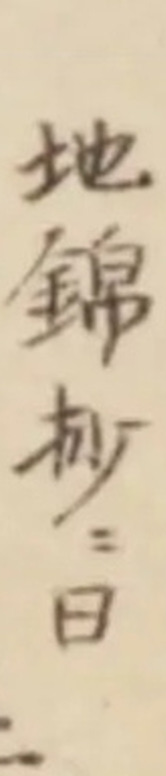地錦抄に曰
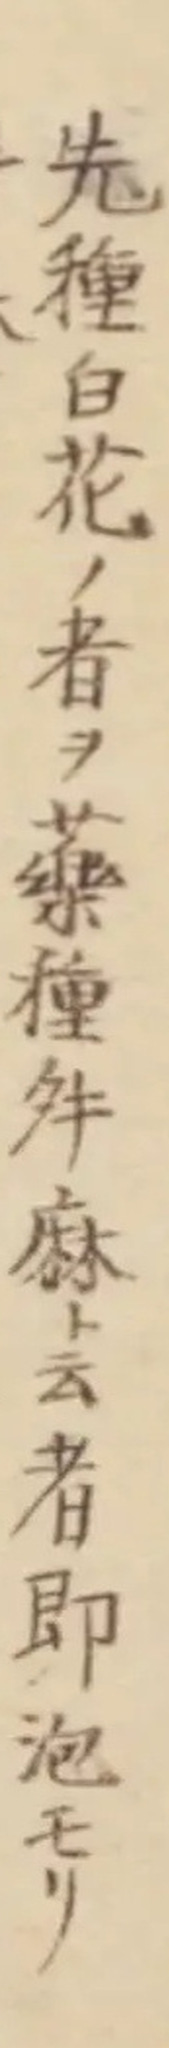先種白花の者を藥種斘麻と云者即泡もり
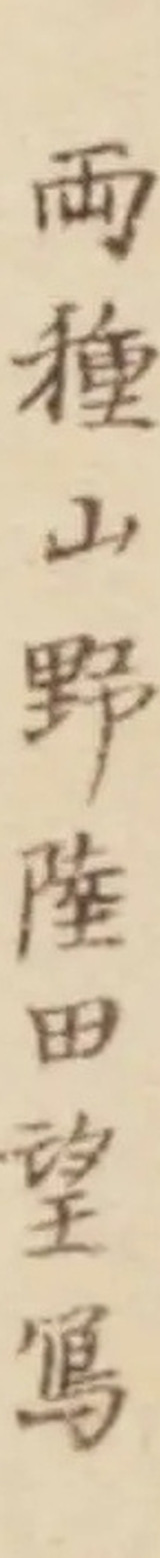両種山野陸田望寫
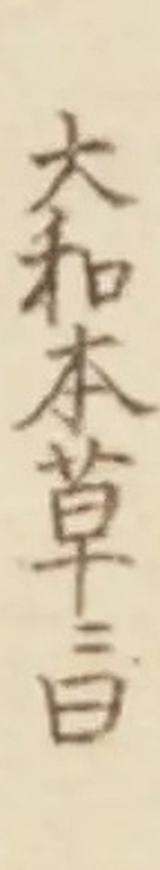大和本草ニ曰
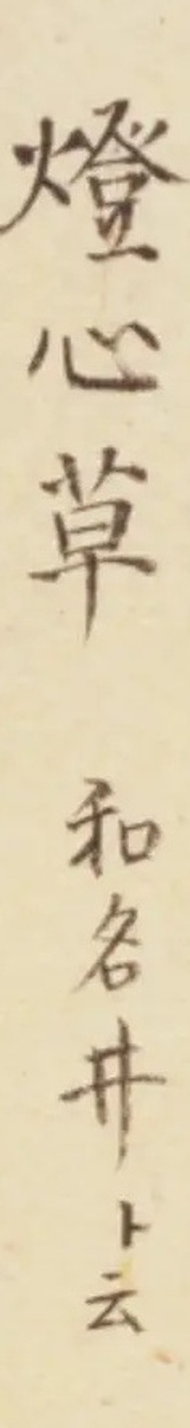燈心草和名井と云
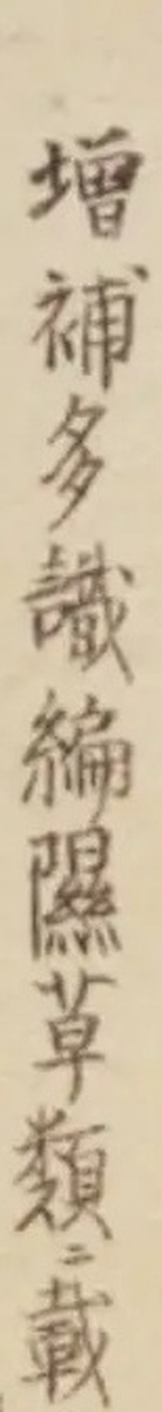増補多識編山草類ニ曰

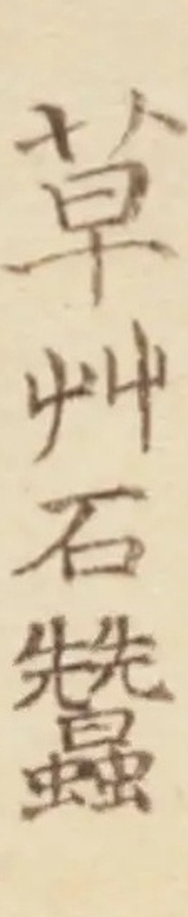草艸石蠶
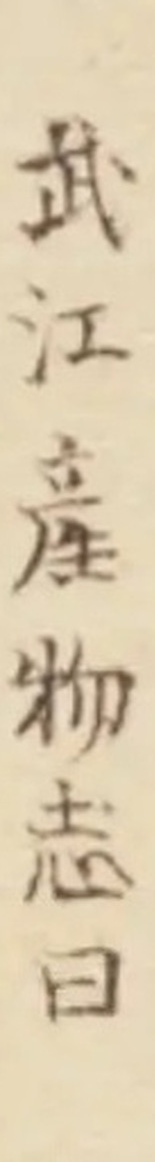武江産物志曰
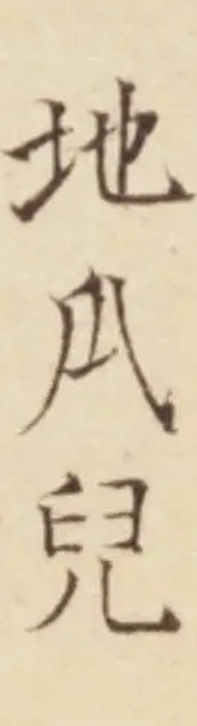地瓜兒
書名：梅園草木花譜夏之部. 2
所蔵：国立国会図書館 National Diet Library, JAPAN
